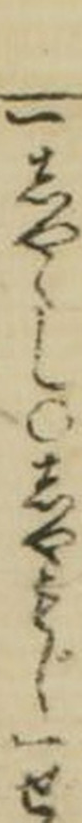一しやくし○しやもじ
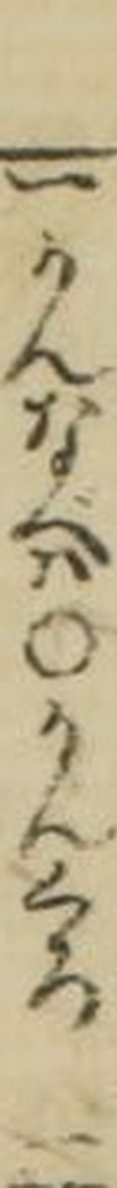一かんなべは○かんくろ
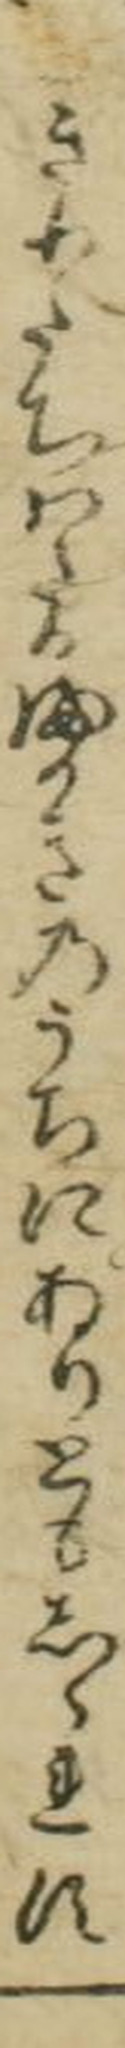きりたちわたるまかきのうちに。ありともしられす
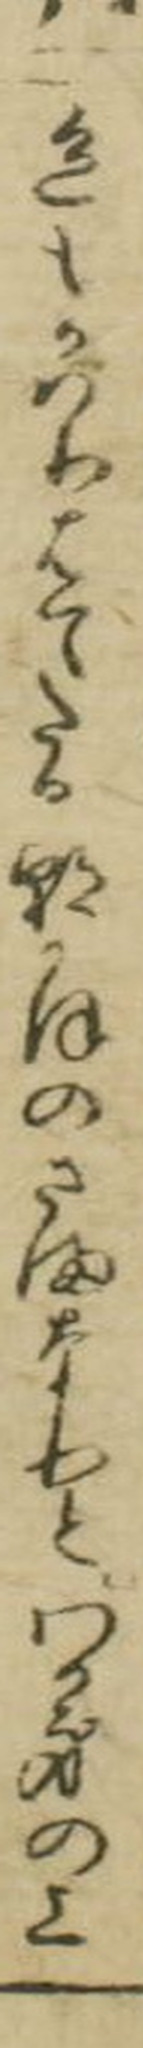色もかはりはてたる朝かほのさまなりと。わか身の上
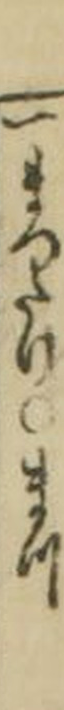一まつたけ○まつ
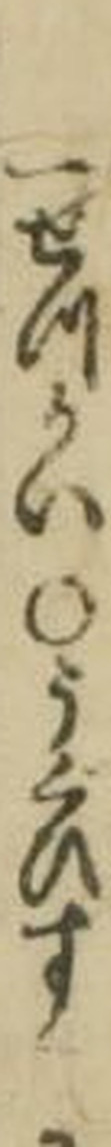一せつかい○うぐひす
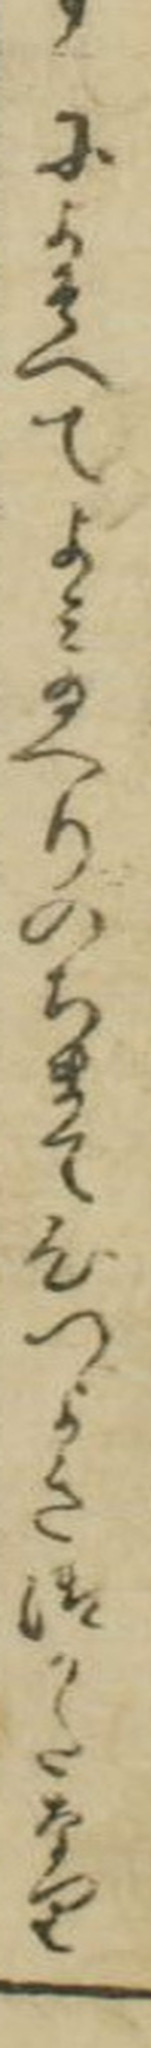によそへてよみ給へり。のちまて心つよき御かたなり
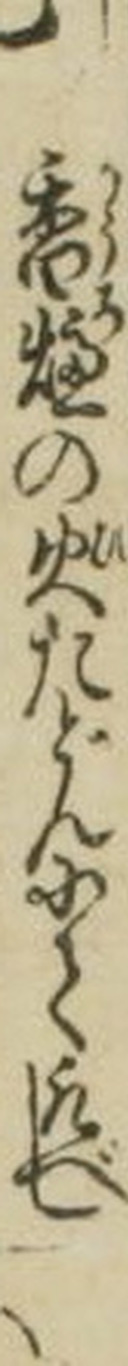香炉の火たどんにて凡べし
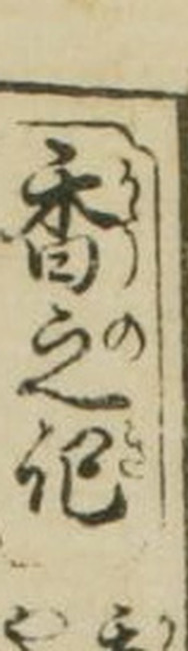香之記
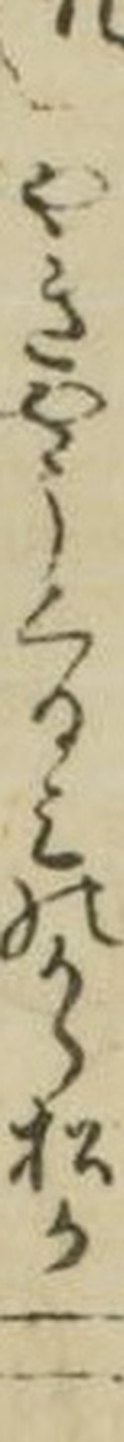やきやうくるみのから松か
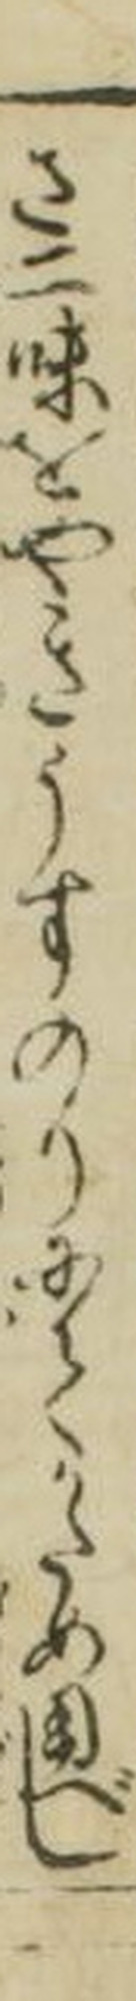さ二味をやきうすのりにてかため用べし
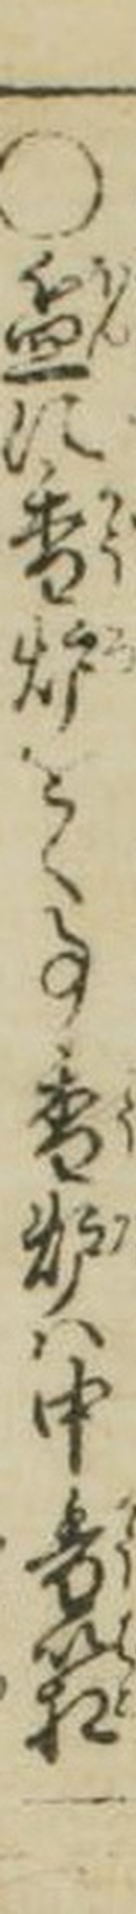○盆に香炉をく事香炉は中香箱
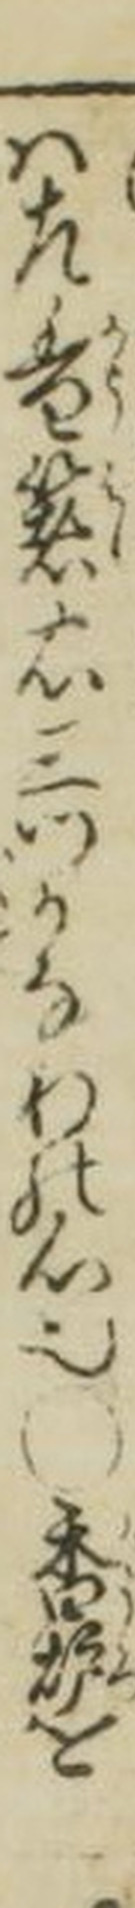は左香箸右三つかなわの心也○香炉を
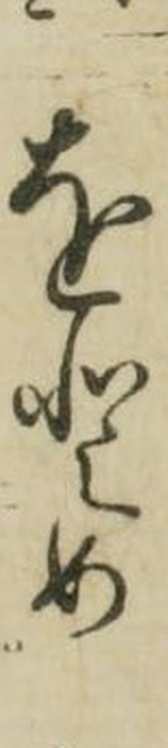をとめ
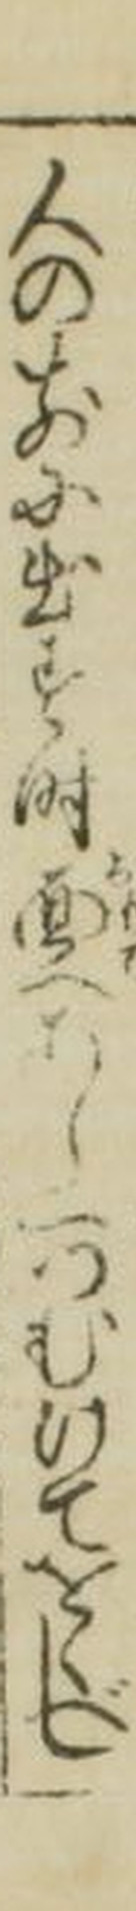人の前に出す時面へあし二つむけてをくべし
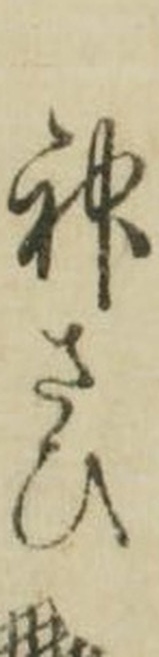神さび
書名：女源氏教訓鑑
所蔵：東京学芸大学附属図書館
